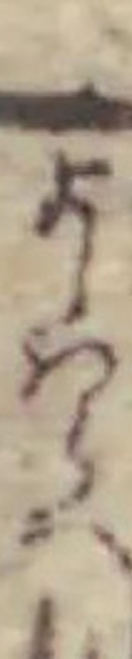よしはらへ
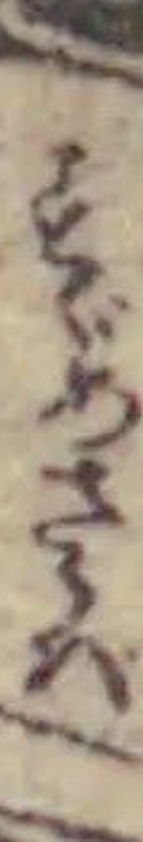すゞめさらば
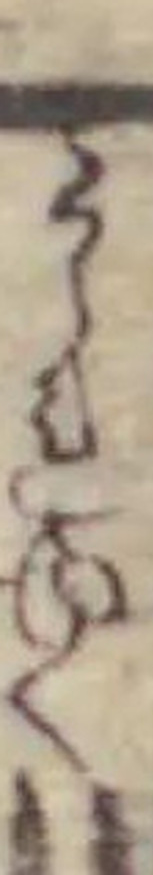うられゆく
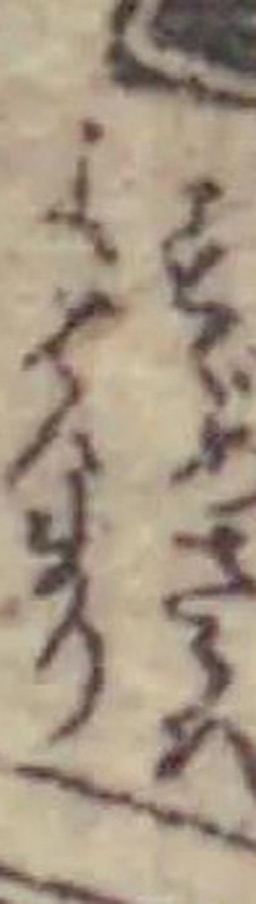よはんまり
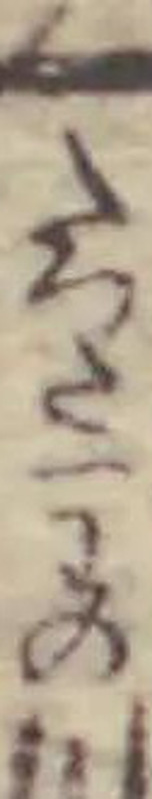たつた一わの
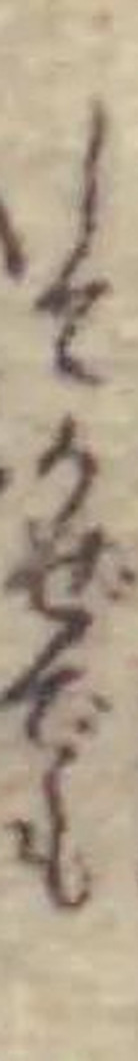してかぜでも
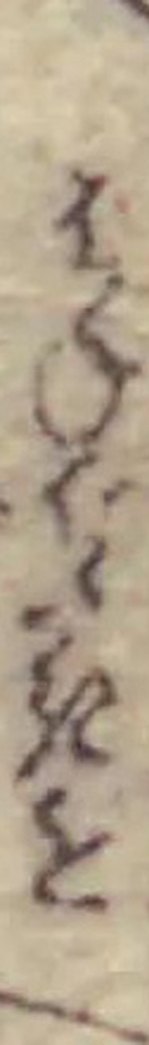はねばたきを
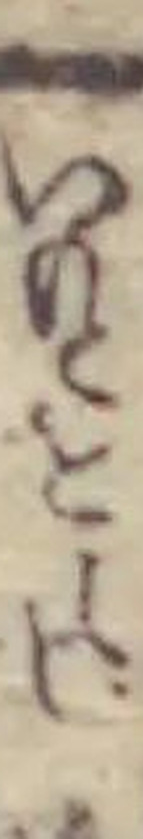いもとをよし
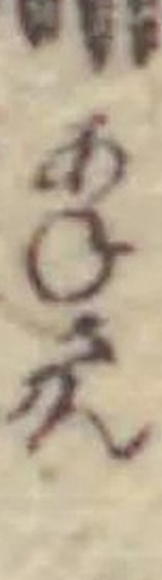あねさん
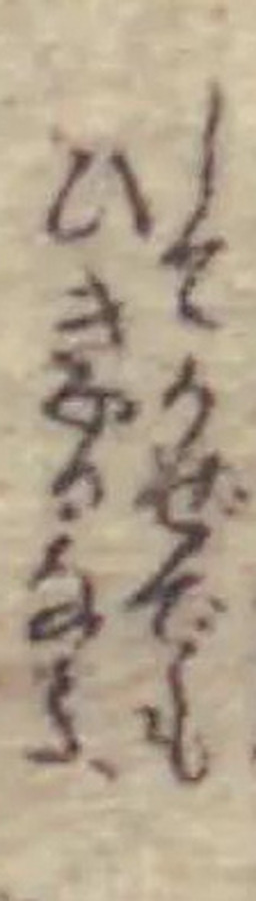ひきなるなよ
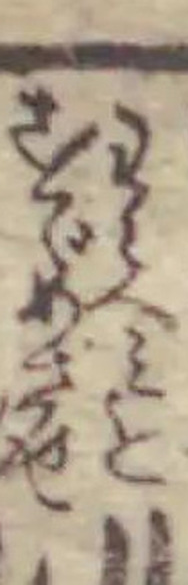すゞめさせ
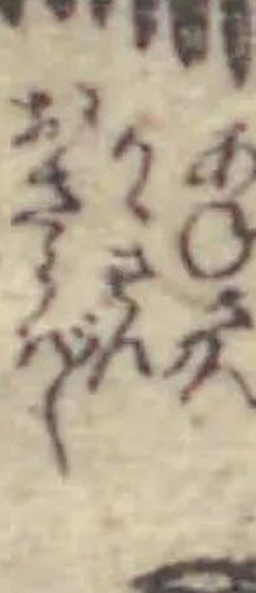おさらば〳〵
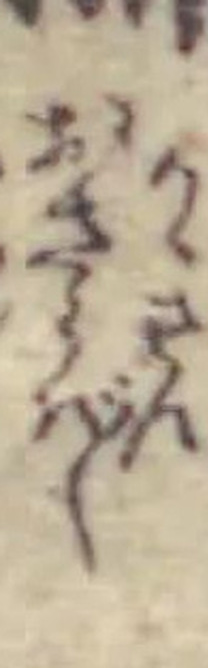おさらば〳〵
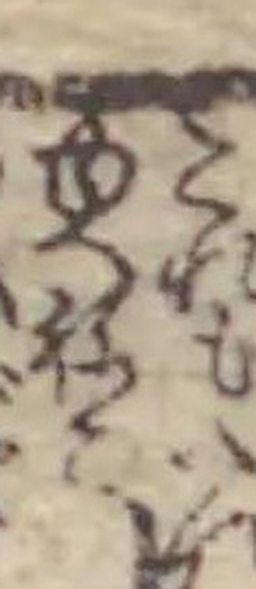ゆへねこ
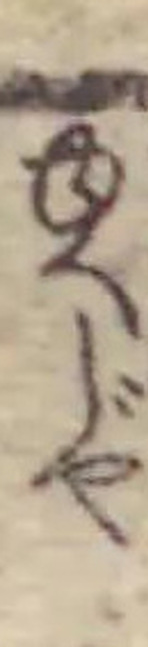ゆへじや
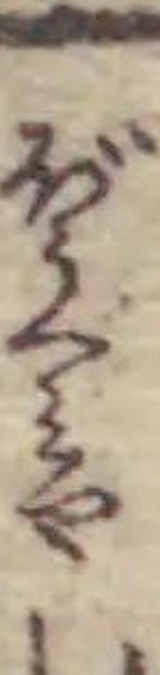ぼうくみや
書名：冷水灰毛猫 2巻
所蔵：国立国会図書館 National Diet Library, JAPAN
